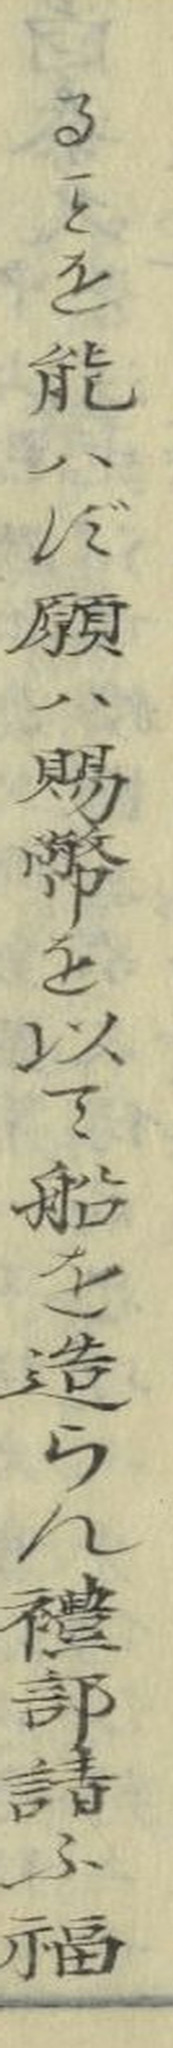ることを能はず願は賜幣を以て船を造らん礼部請ふ福
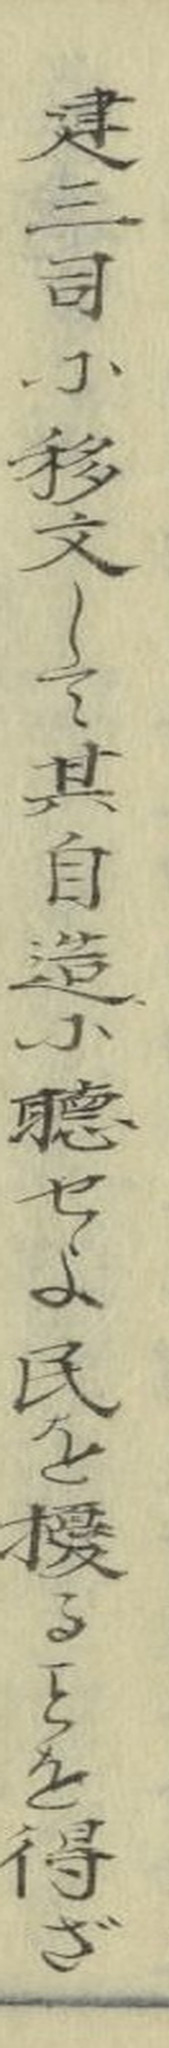建三司に移文して其自造に聴せよ民を擾ることを得ざ
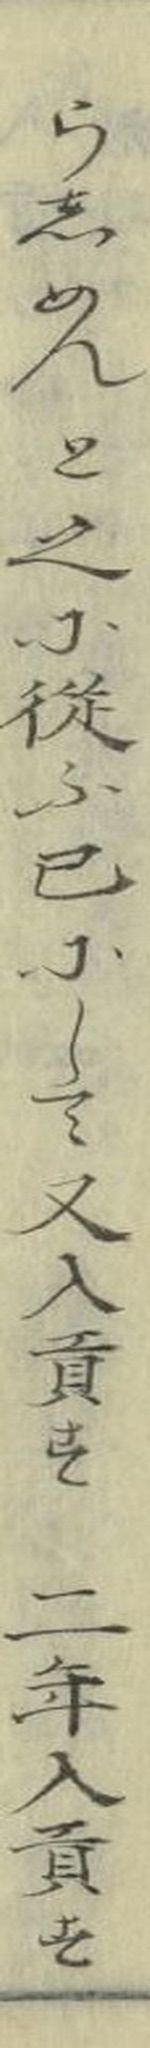らしめんと之に従ふ已にして又入貢す二年入貢す
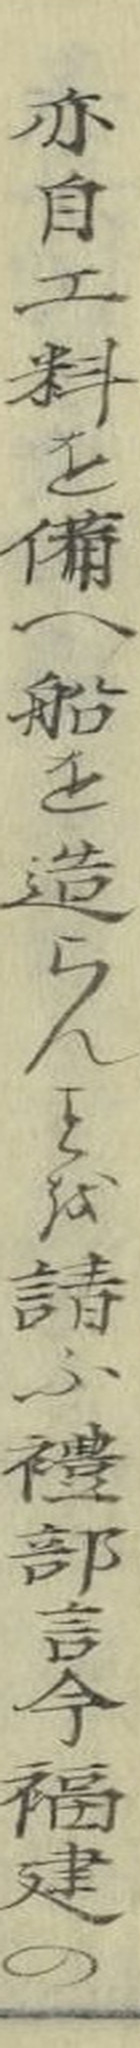亦自工料を備へ船を造らんことを請ふ礼部言今福建の
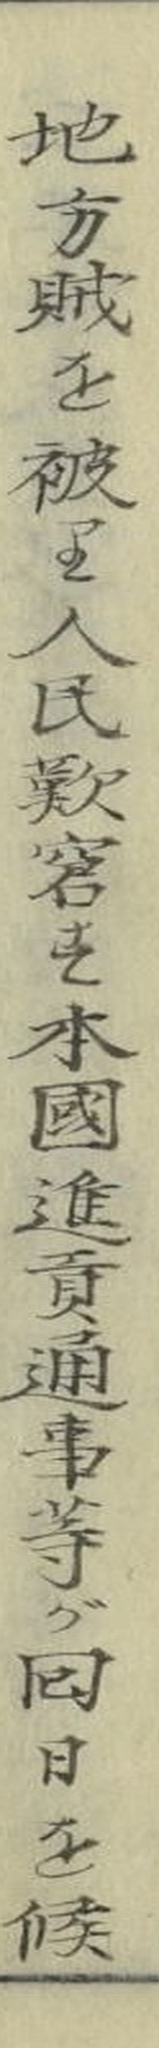地方賊を被り人民歎窘す本国進貢通事等が回日を候
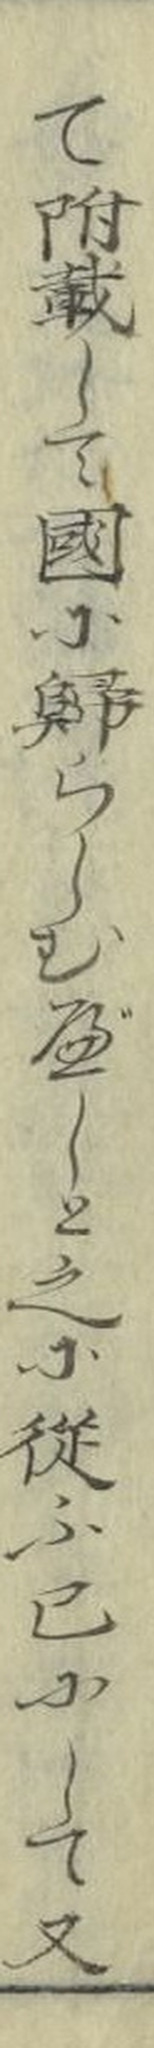て附載して国に帰らしむべしと之に従ふ已にして又
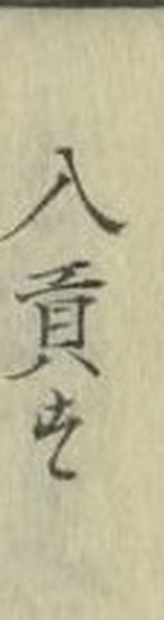入貢す

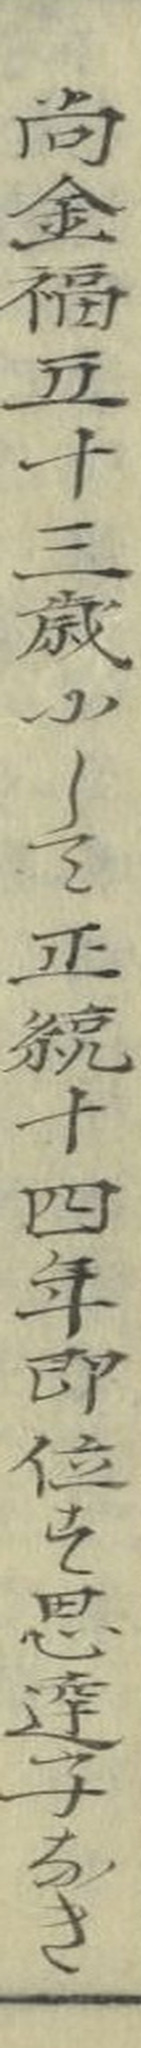尚金福五十三歳にして正統十四年即位す思達子なき
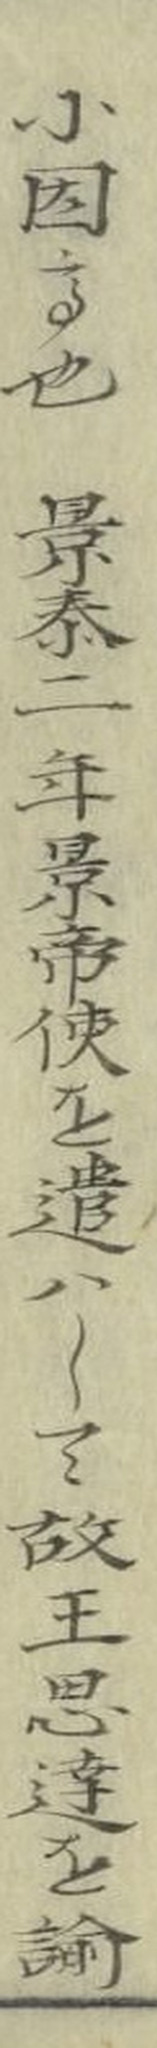に因て也景泰二年景帝使を遣はして故王思達を諭
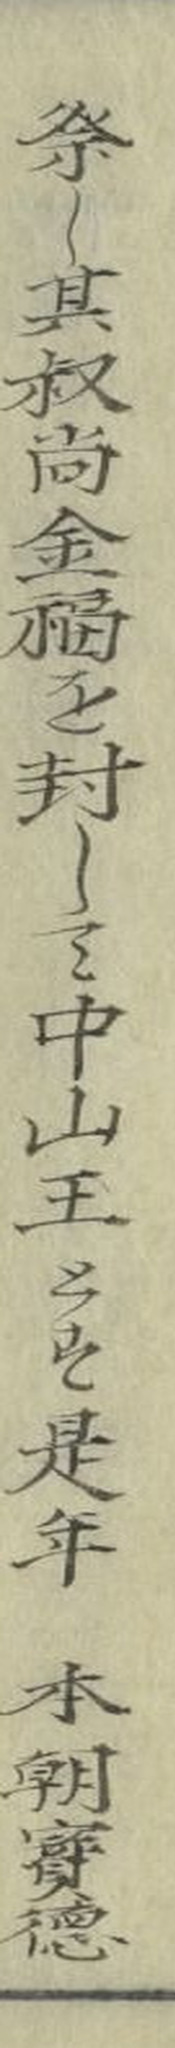祭し其叔尚金福を封して中山王とす是年本朝宝徳
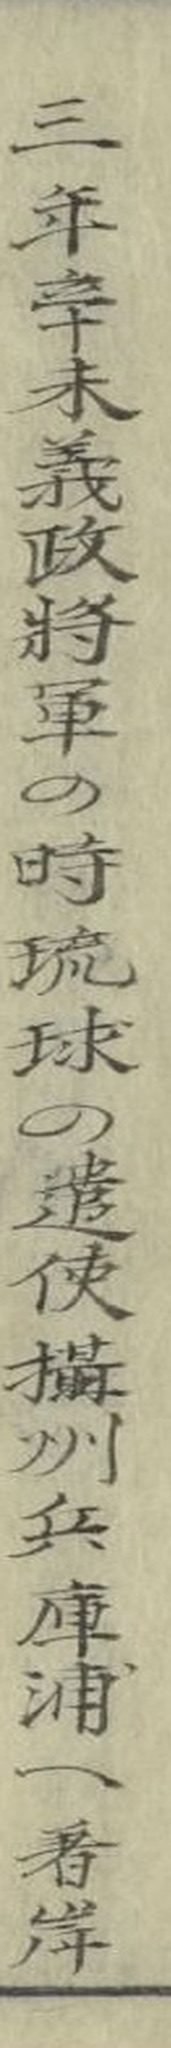三年辛未義政将軍の時琉球の遣使摂州兵庫浦へ着岸
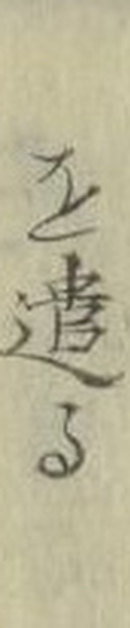を遣る
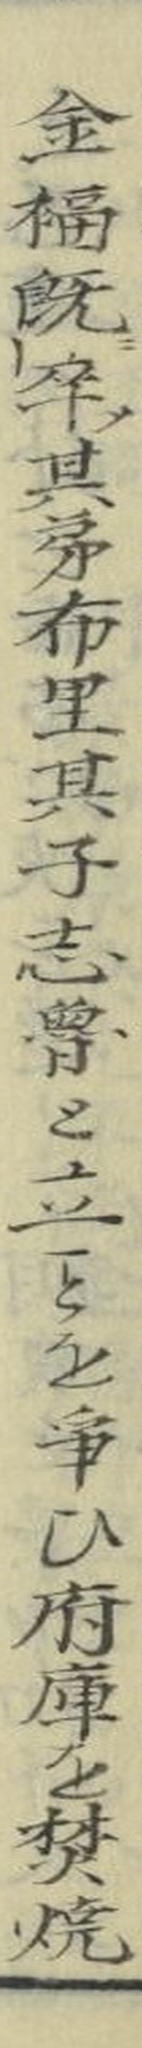金福既-卒其弟布里其子志魯と立ことを争ひ府庫を焚焼
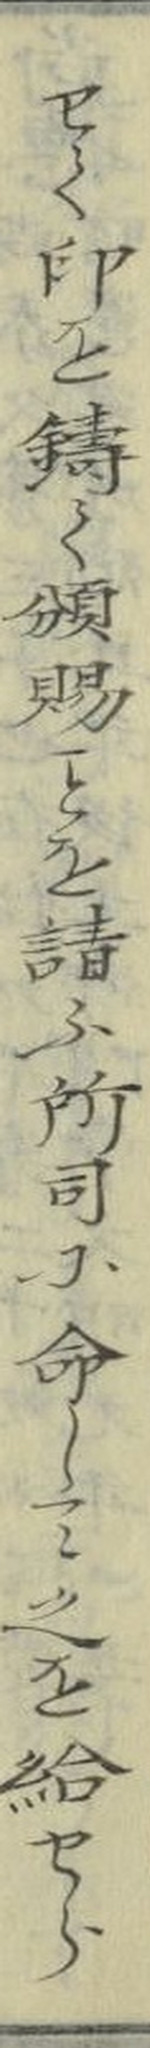せて印を鋳て頒賜ことを請ふ所司に命して之を給せら
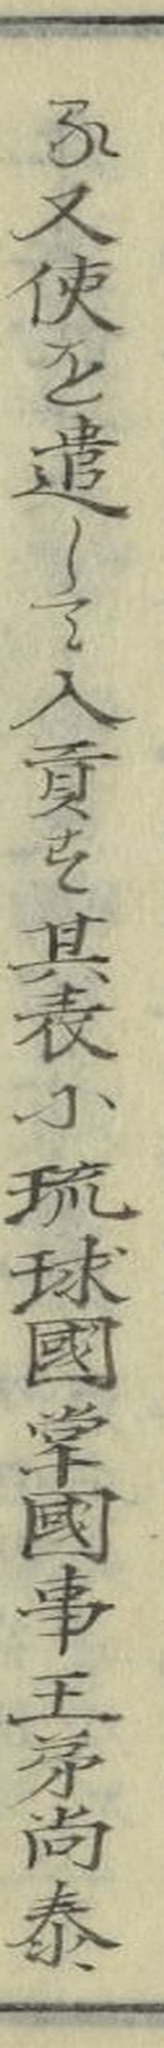る又使を遣して入貢す其表に琉球国掌国事王弟尚泰
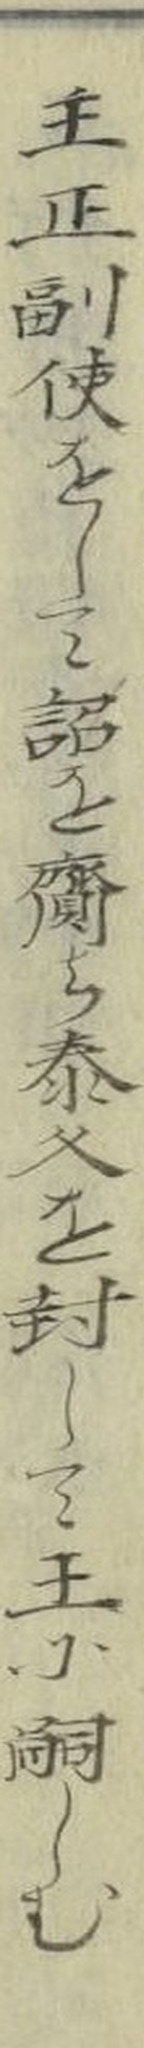主正副使をして詔を齎て泰久を封して王に嗣しむ
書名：琉球沿革志 下
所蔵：University of the Ryukyus Library
